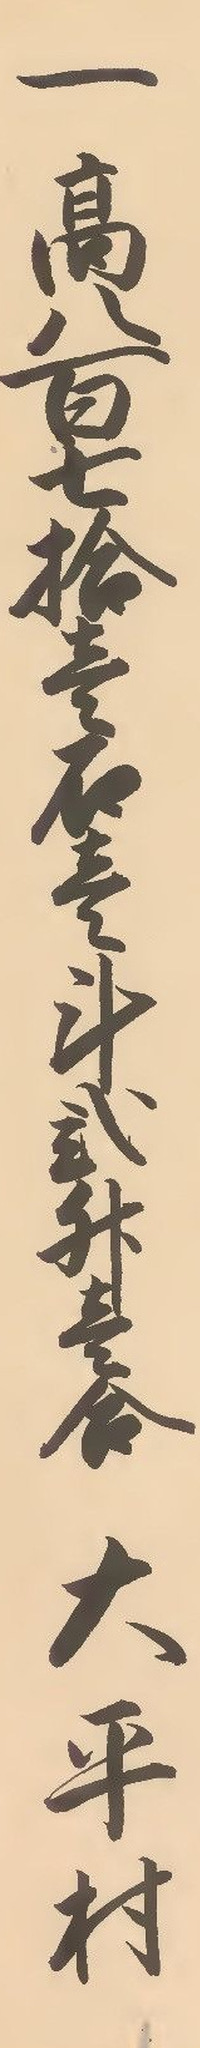一高八百七拾壱石壱斗弐升壱合大平村

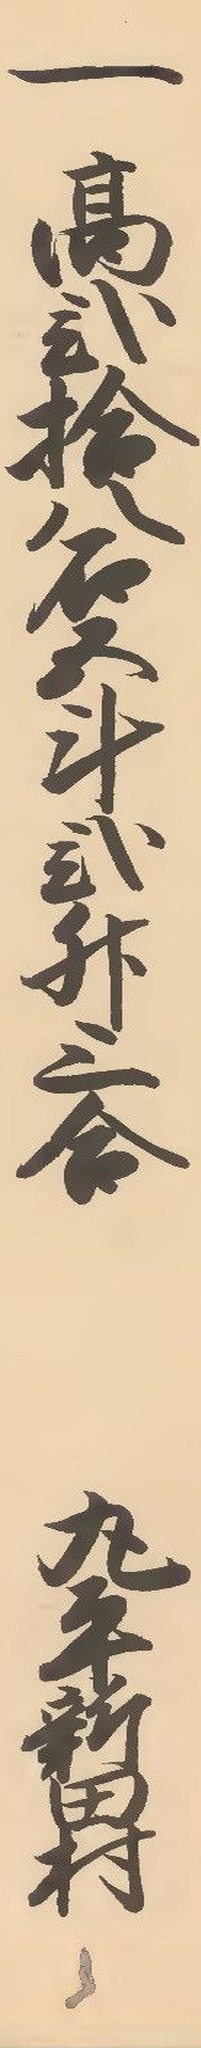一高弐拾八石五斗弐升三合丸平新田村
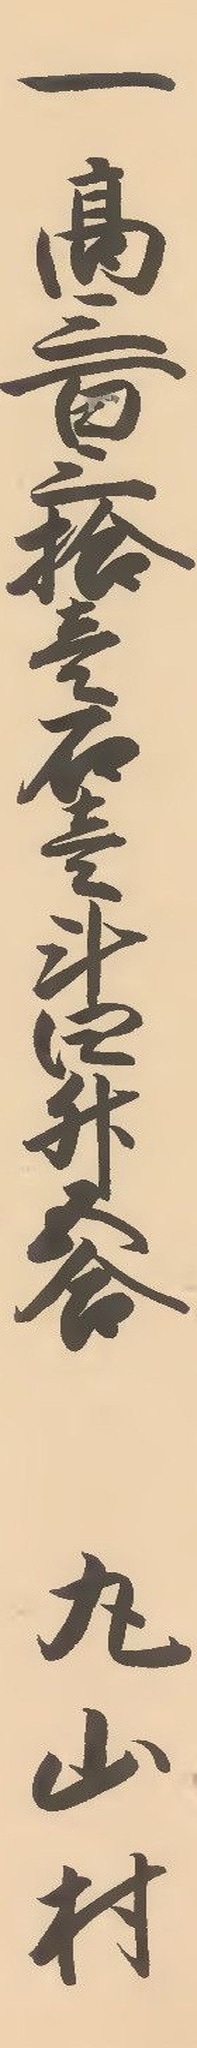一高三百三拾壱石壱斗四升五合丸山村
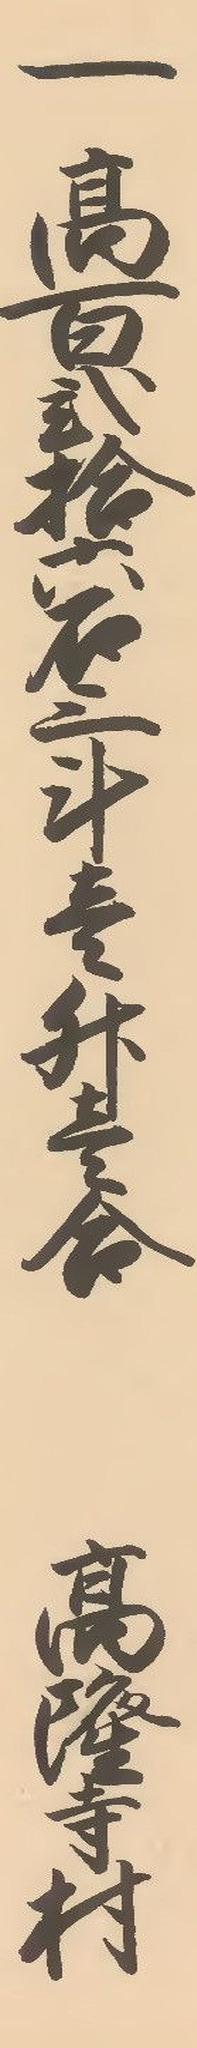一高百弐拾六石三斗壱升壱合高隆寺村
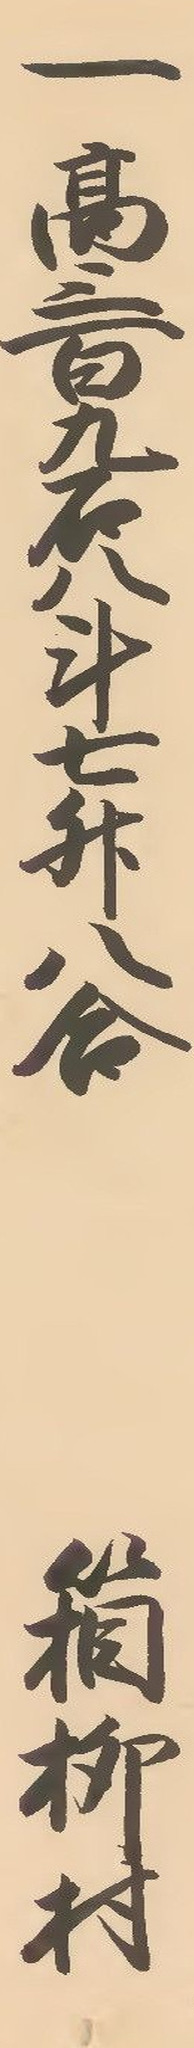一高三百九石八斗七升八合箱柳村
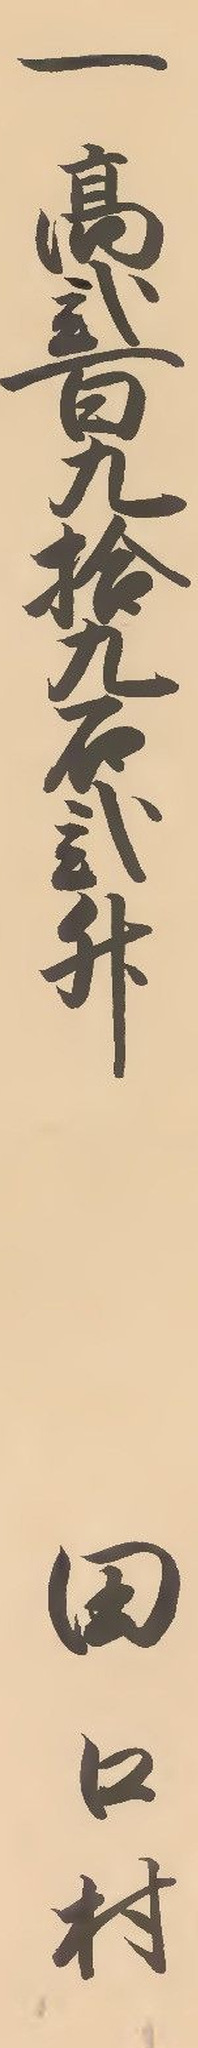一高弐百九拾九石弐升田口村
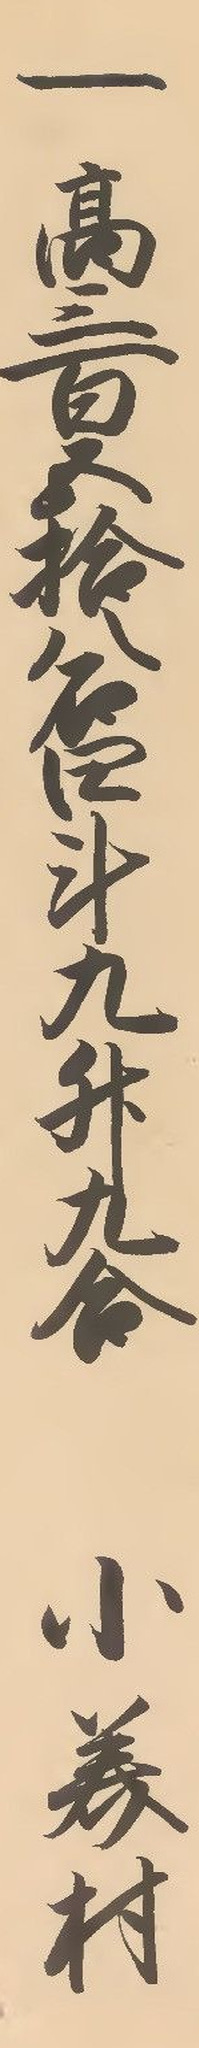一高三百五拾八石四斗九升九合小美村
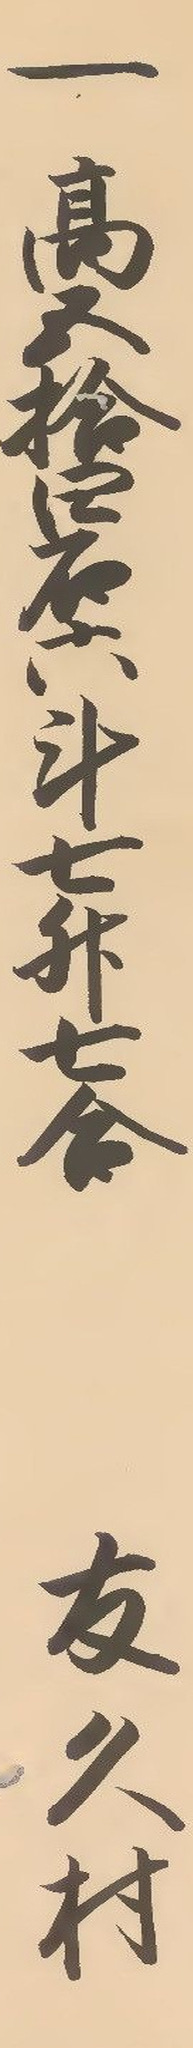一高五拾四石六斗七升七合友久村
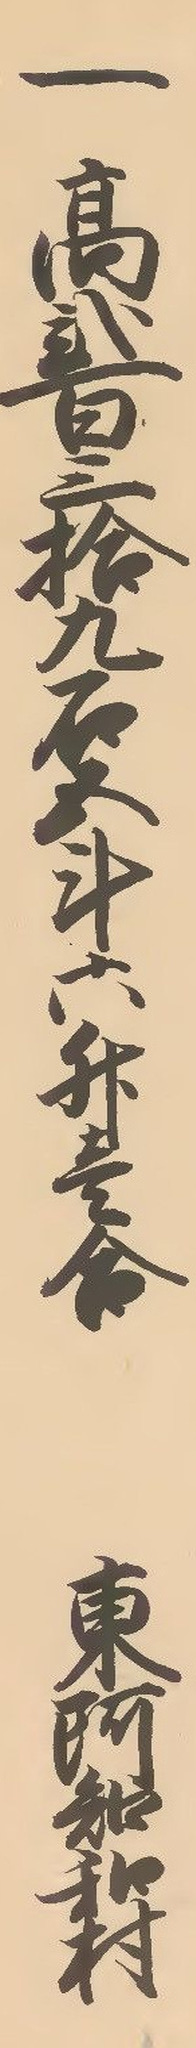一高弐百三拾九石五斗六升壱合東阿知和村

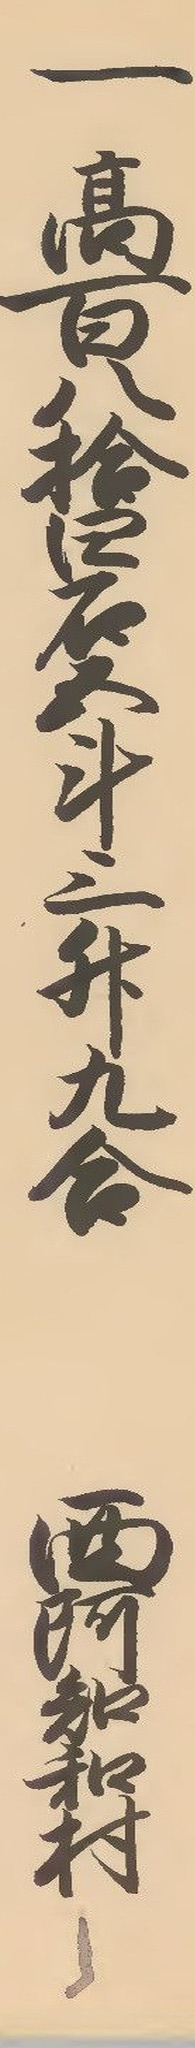一高百八拾四石五斗三升九合西阿知和村
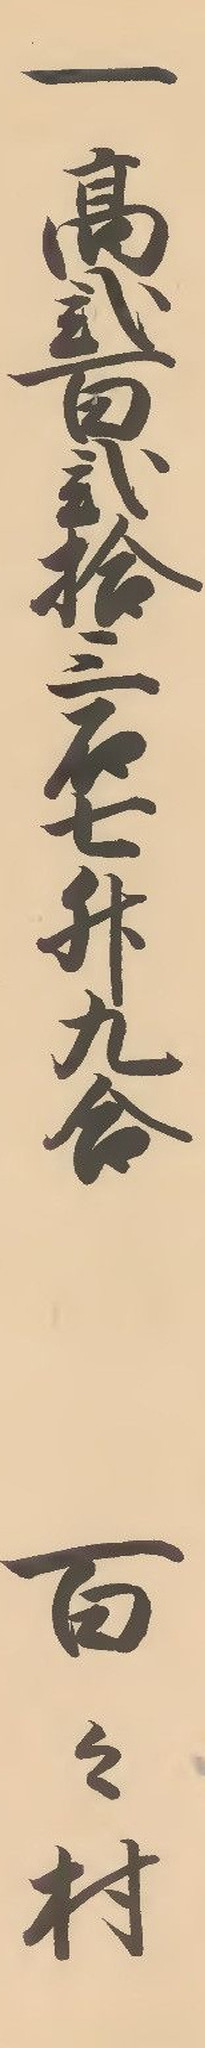一高弐百弐拾三石七升九合百々村
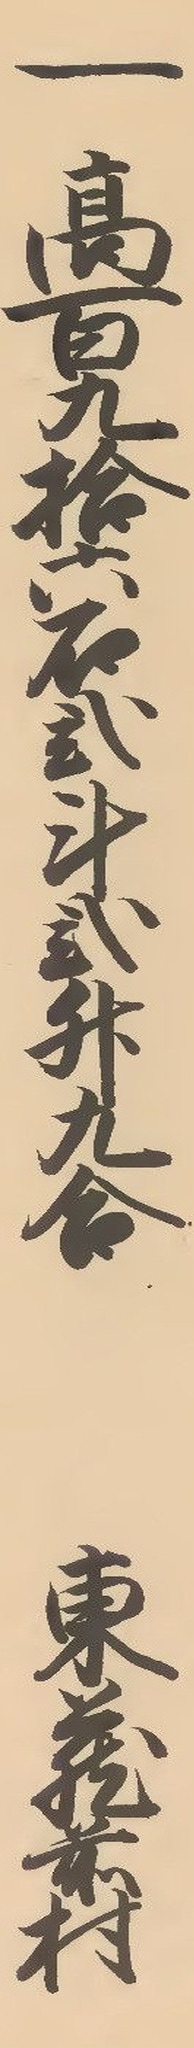一高百九拾六石弐斗弐升九合東蔵前村
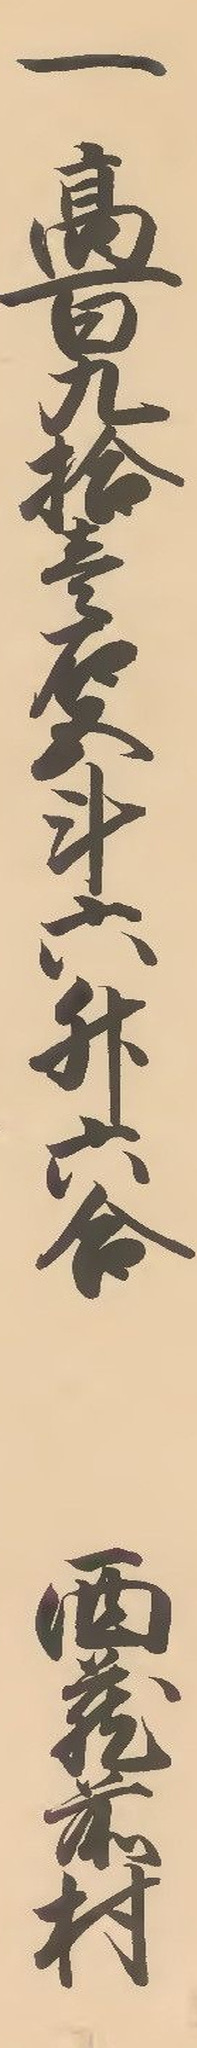一高百九拾壱石五斗六升六合西蔵前村
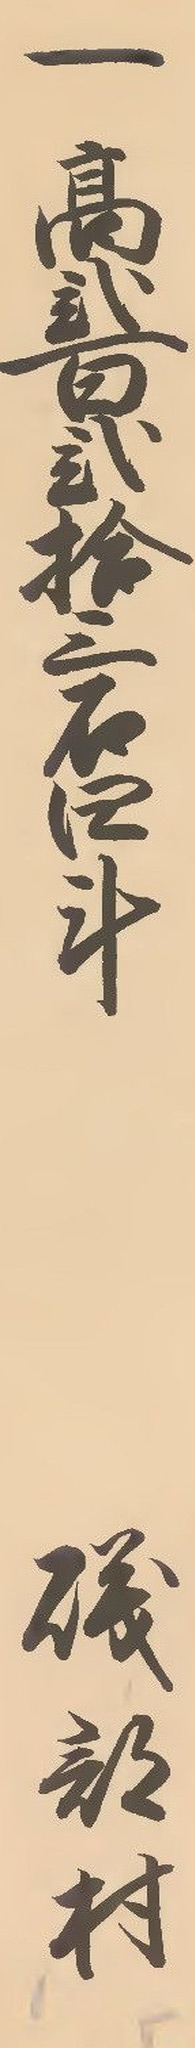一高弐百弐拾三石四斗磯部村
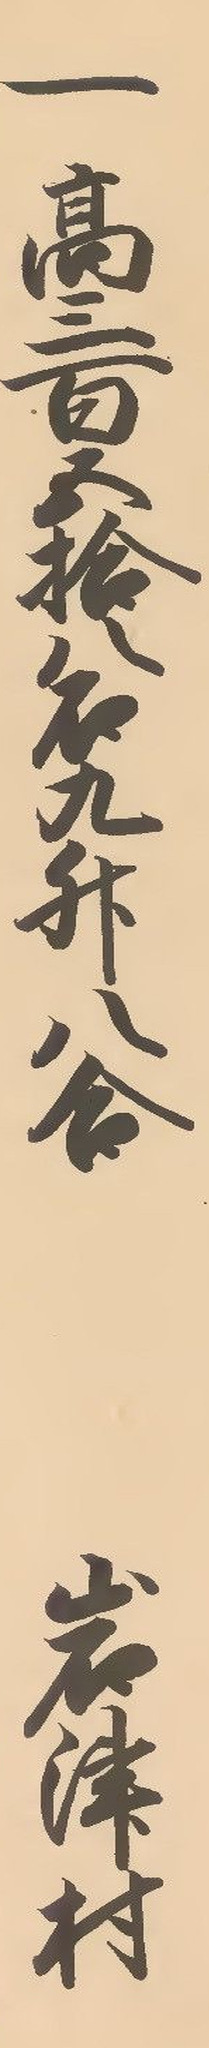一高三百五拾八石九升八合岩津村
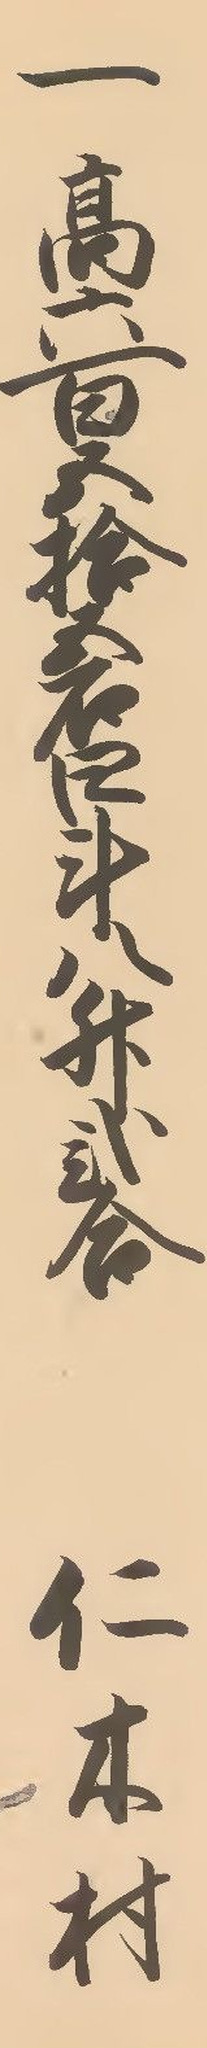一高六百五拾五石四斗八升弐合仁木村
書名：三河国郷帳
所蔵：国立公文書館 National Archives of Japan
